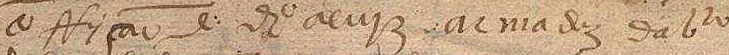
c̄offysão de djo al̄urz armadez davro
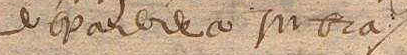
do bpado de coJnbra ./
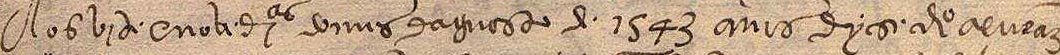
Aos vjte e nove djas do mes daguosto de 1543 an̄os dyse dio alur̄az
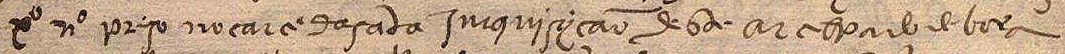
xo no preso no carçe da sata Jmqujsyção deste arcebpado devora
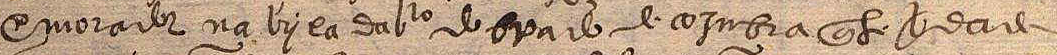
e morador na vyla davro do bpado de coJnbra q̄ he ꝟdade
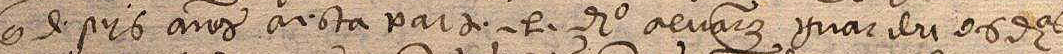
q̄ de sejs an̄os a esta parte ele dio aluārz guardou os djas
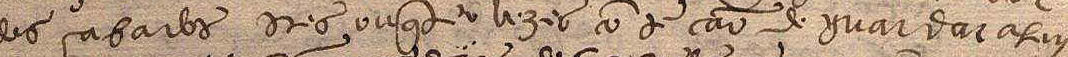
dos sabados tres ou q̄tro vezes cō tēção de guardar a Ley
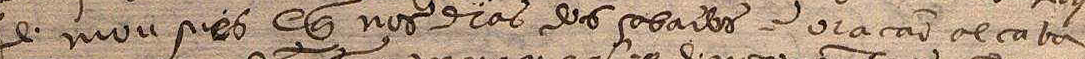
de mousees e q̄ nos dias dos sabados ē oracão alçava
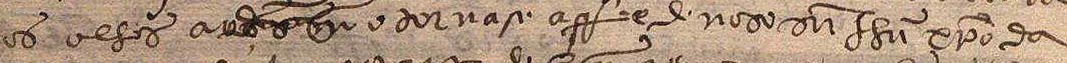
os olhos aods̄q̄ o tornase a ffee de noso sōr Jhū xp̄o da
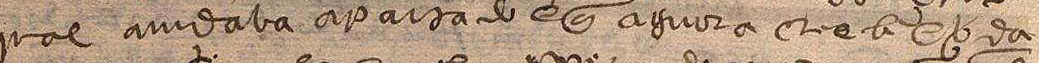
qual amdava apartado e q̄ aguora cree bē e ꝟda
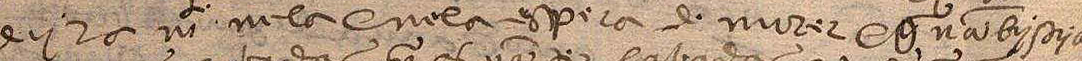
dejramte nela e nela espera de morer e q̄ não vystya
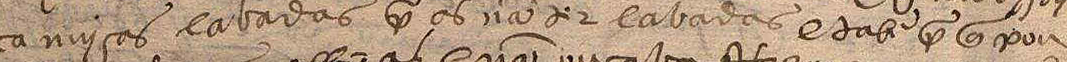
camysas lavadas p̄o as não ter lavadas e tabē p̄o q̄ pou
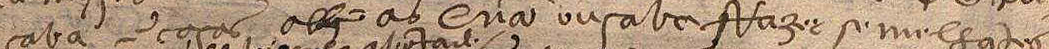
sava ē casas alheas e não ousava ffazer semelhates
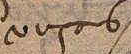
cousas
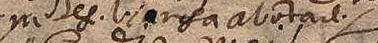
nē lhe vjnha a vōtade /
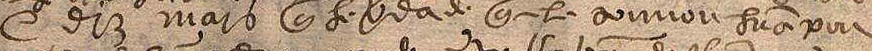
e diz majs q̄ he ꝟdade q̄ ele tomou huā pou
